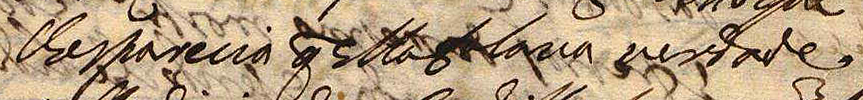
lhes parecia q̄ Ella falaua uerdade
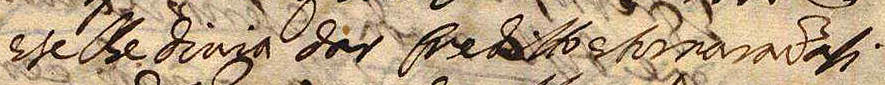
E se lhe diuia dar Creditto E tornaraõ asi
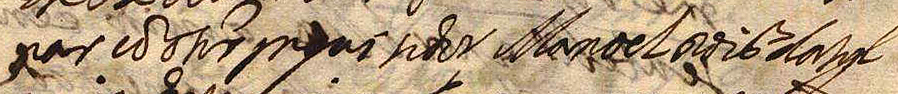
nar cō o sor̄ jnquisidor Manoel Rois̄ da syl
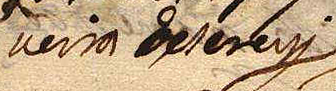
ueira o escreuj
